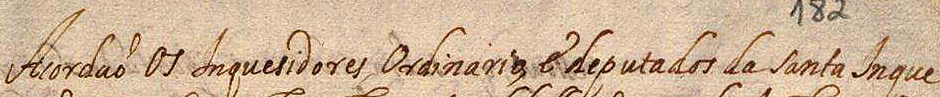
Acordaõ os Inquesidores, Ordinario, e deputados da santa Inque
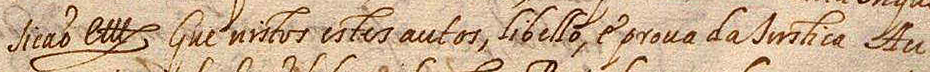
siçaõ etttꝭ Que uistos estes autos, libello, e proua da Iustiça Au
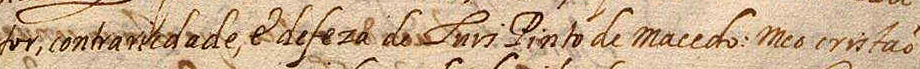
tor, contrariedade, e defeza de Luis Pinto de macedo: meo cristaõ
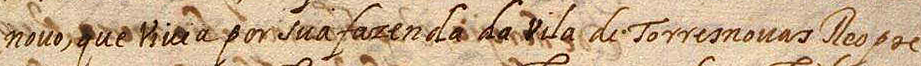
nouo, que Viuia por sua fazenda da vila de Torres nouas Reo pre
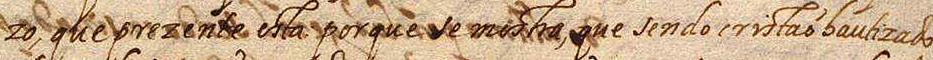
zo, que prezente esta porque se mostra, que sendo cristaõ bautizado
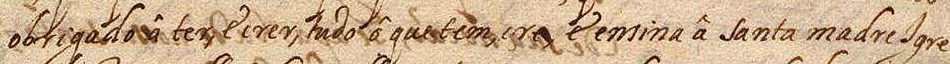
obrigado â ter, e crer, tudo ô que tem, cre e ensina â santa madre Igre
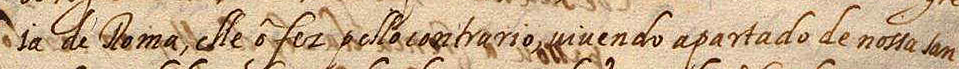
ia de Roma, elle ô fez pello contrario, uiuendo apartado de nossa san
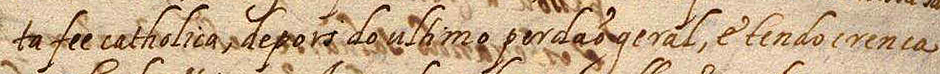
ta fee catholica, depois do ultimo perdaõ geral, e tendo crença
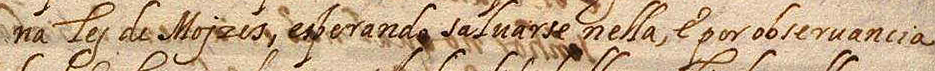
na Lej de Mojzes, esperando saluarse nella, e por obseruancia
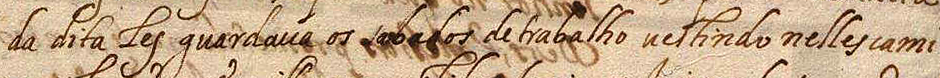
da dita Lej guardaua os sabados de trabalho uestindo nelles cami
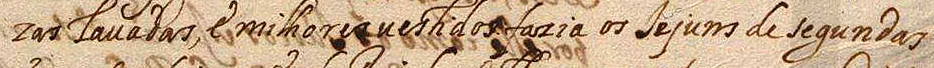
zas Lauadas, e milhores uestidos fazia os Jejuns de segundas
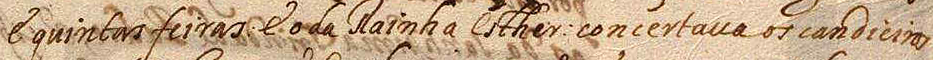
e quintas feiras e o da Rainha esther concertaua os candieiros
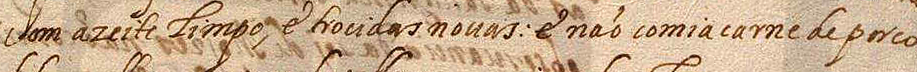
com azeite Limpo, e trocidas nouas: e naõ comia carne de porco
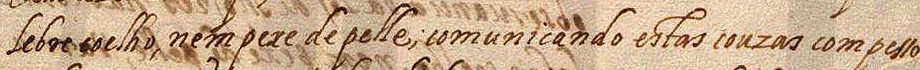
Lebre coelho, nem pexe de pelle; comunicando estas couzas com pesso
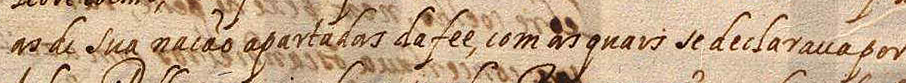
as de sua nação apartadas da fee, com as quais se declaraua por
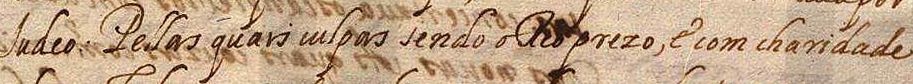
Iudeo. Pellas quais culpas sendo o Reo prezo, e com charidade
